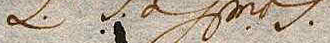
L. s.a Jlmas.
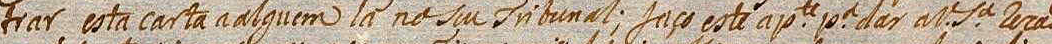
trar esta carta a alguem lá no seu Tribunal; faço este a p.te p.a dar a V. S.a Rezaõ
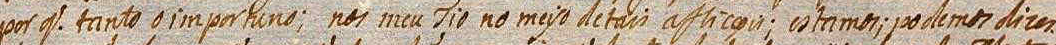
porq̄. tanto o importuno; nos meu Tio no meyo de tais afliçois; estamos; podemos dizer
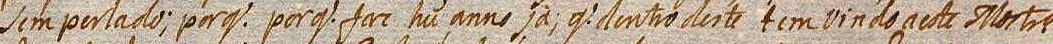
sem perlado; porq̄. porq̄. faz hū anno ja; q̄. dentro deste tem vindo a este Mostr.o
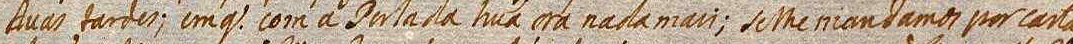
duas tardes; em q̄. com a Perlada huā ora nada mais; se lhe mandamos por carta
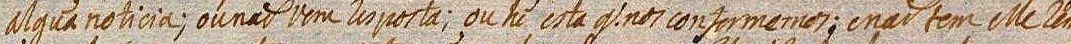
alguā noticia; ou naõ vem Resposta; ou hé esta q̄. nos conformemos; e naõ tem elle Remo
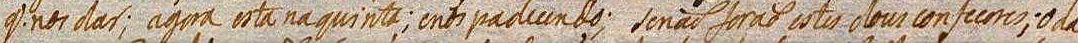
q̄. nos dar; agora esta na quinta; e nós padecendo; senaõ foraõ estes dous confecores; o da
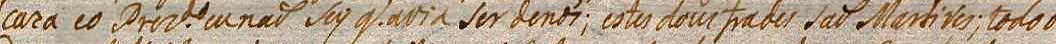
caza e o Prez.do eu naõ sey q̄. avia ser de nós; estes dous frades saõ Martires; todo o
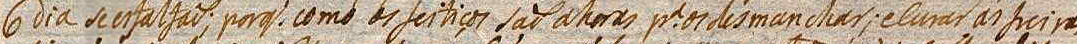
dia se esfalfaõ; porq̄. como os feitiços saõ a horas p.a os desmanchar; e curar as freiras
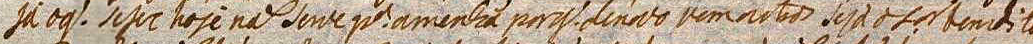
ja o q̄. se fez hoje naõ serve p.a amanhã porq̄. de novo vem outros seja o s.or bemdito
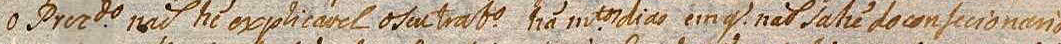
o Prez.do naõ hé explicavel o seu trab.o há m.tos dias em q̄. naõ sahé do confecionario
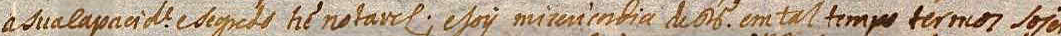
a sua capacid.e e segredo hé notavel; e foy misericordia de Ds̄ em tal tempo termos sojei
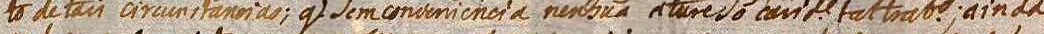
to de tais circunstancias; q̄. sem conveniencia nenhuā ature só carid.e tal trab.o; ainda
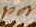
por
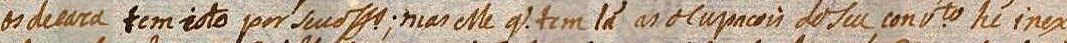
os de caza tem isto por seu offo.; mas elle q̄. tem lá as ocupacois do seu conv.to hé inex
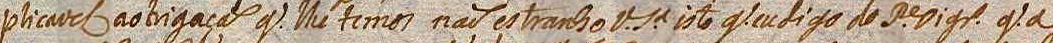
plicavel a obrigaçaõ q̄. lhe temos naõ, estranho V. S.a isto q̄. eu digo do P.e Vigr.o q̄. a
